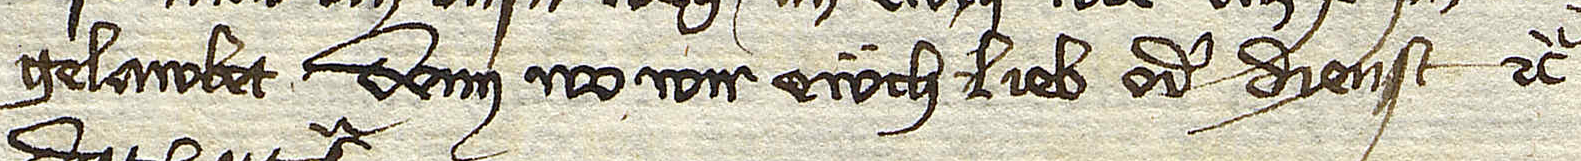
gelawbet / Denn wo wir ewch lieb od* dienſt ec*
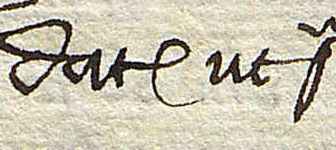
Dat* ut ſ*
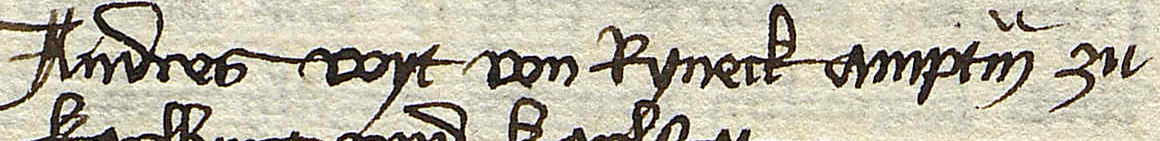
Andres voyt von Ryneck amptm* ʒu
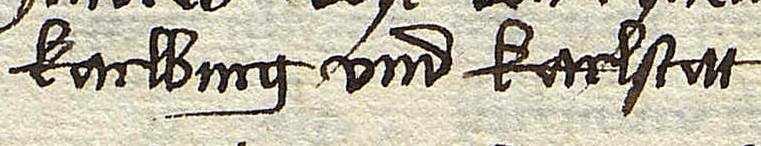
Karlburg vnd Karlſtat
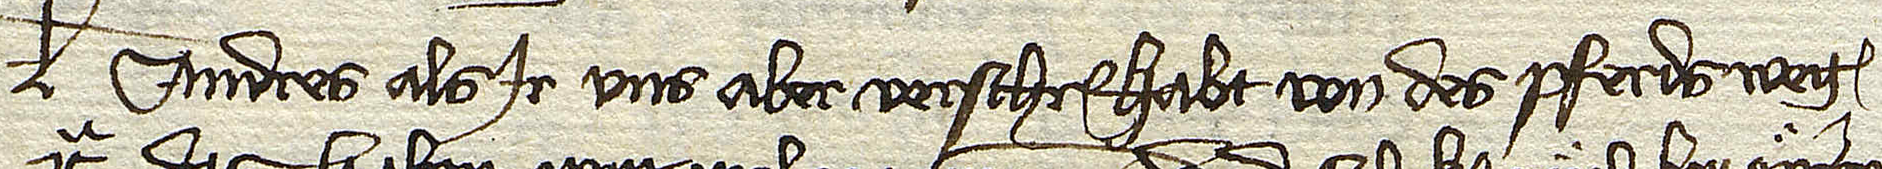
L* Andres als Ir vns aber verſchr* habt von des pferds weg*
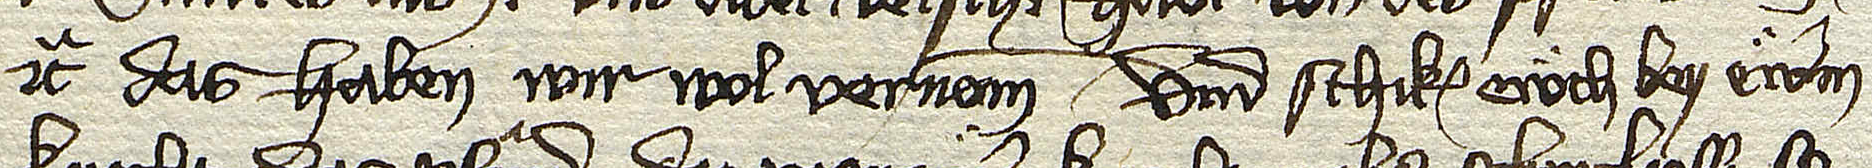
ec* das haben wir wol vernom* / Vnd ſchik* ewch bey ew*m
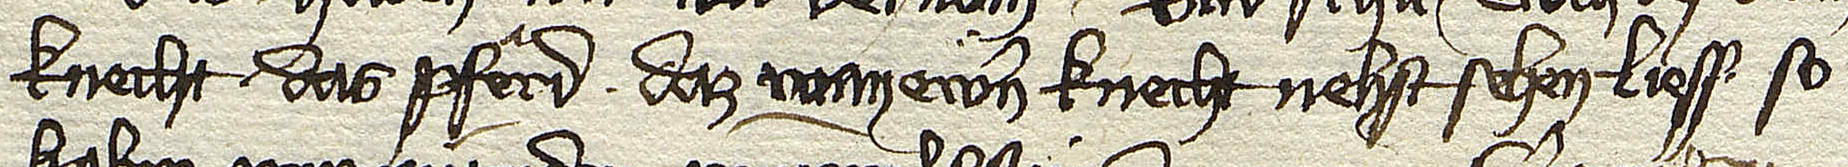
knecht / das pfërd . daʒ man ew*n knecht nehſt ſehen lieſſ . ſo
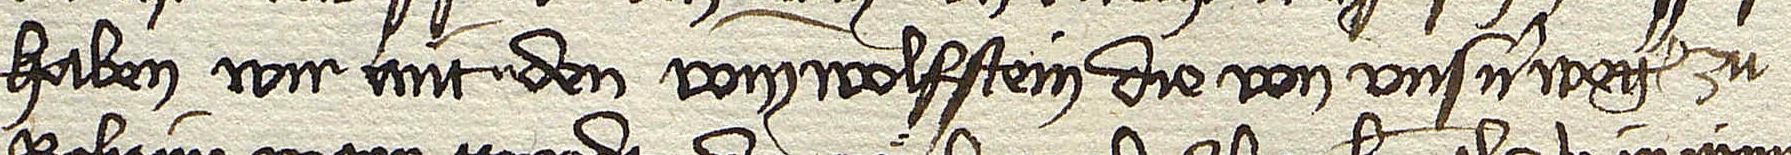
haben wir mit ~den vom* wolfſtein die von vnſ*n weg* ʒu
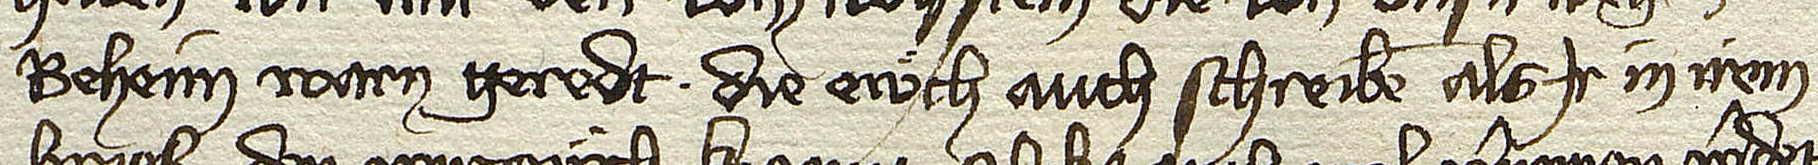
Beheim warn geredt . die ewch auch ſchreibe* als Ir in irem
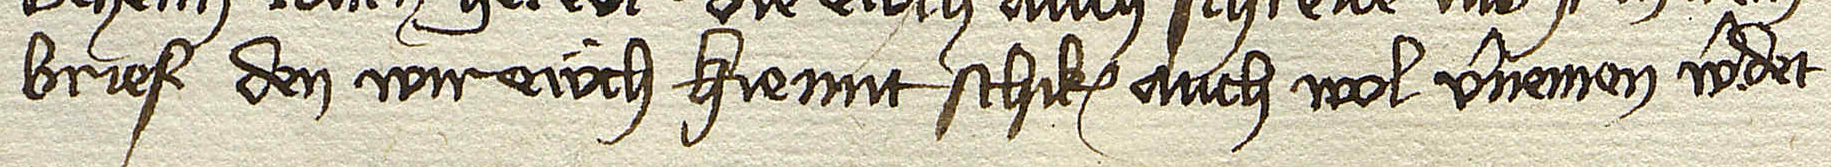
brief den wir ewch hiemit ſchik* auch wol v*nemen w*det
